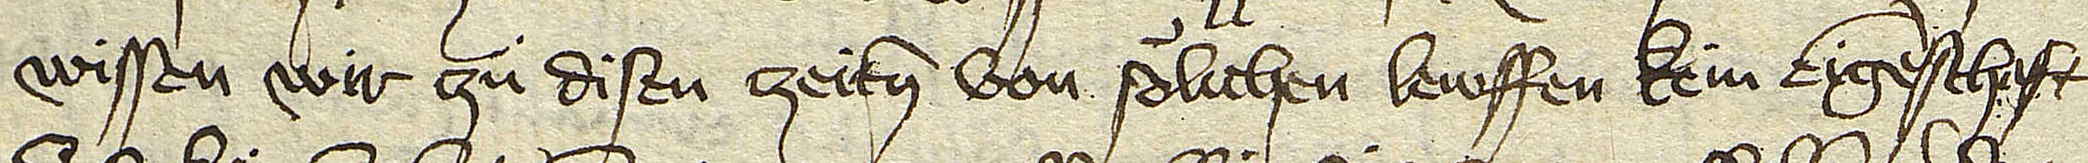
wiſſen wir cʒü diſen cʒeitn* von ſölichen lewffen kein eige*ſchaft
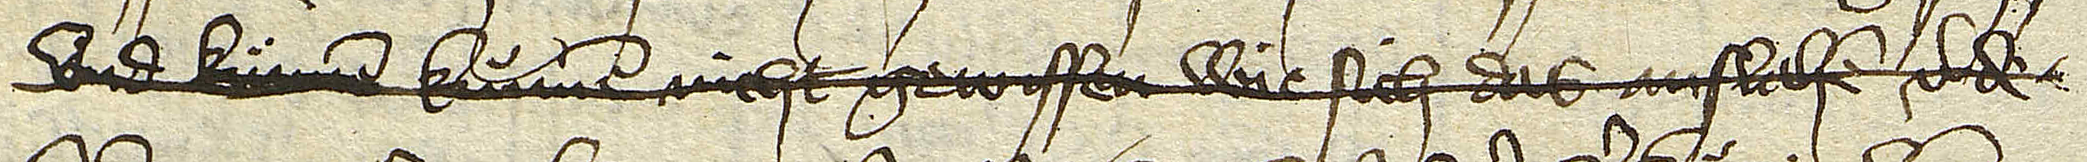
vnd künne* künne* nicht gewiſſen wie ſich das auſlahe* w*de /
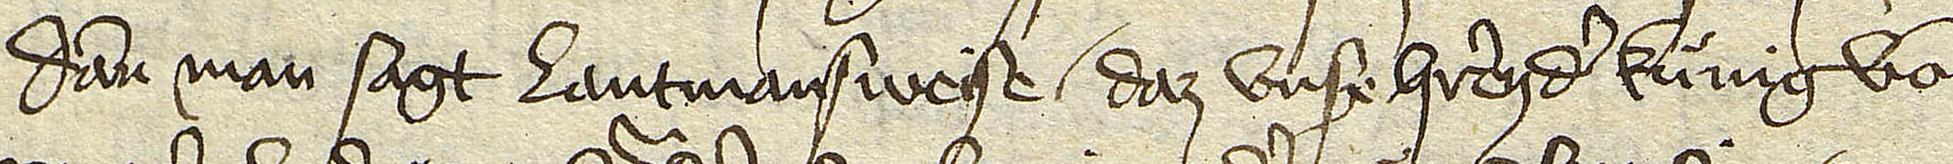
da*n man ſagt Lantmanſweiſe / daʒ vnſ*e hr*en d* künig vo*
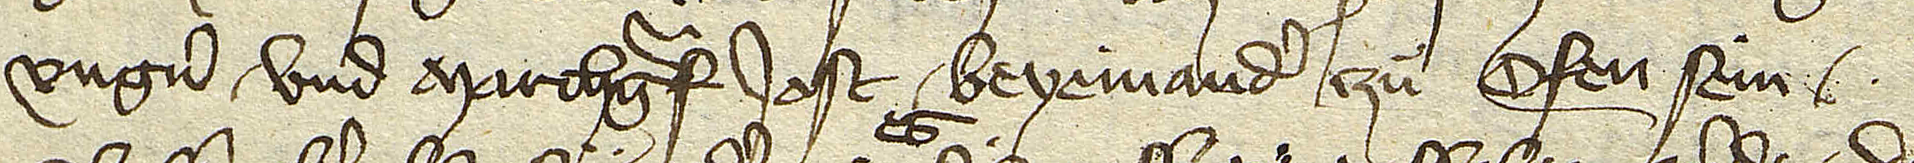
vngn* / vnd Marchg*f Ioſt / beyeinand* cʒü Ofen ſein / .
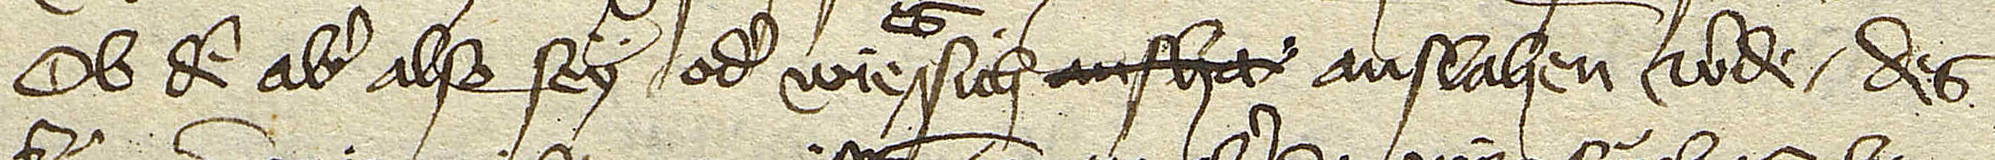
Ob d* ab* alſo ſey / od* wie ſich auſha auſlahen w*de / des
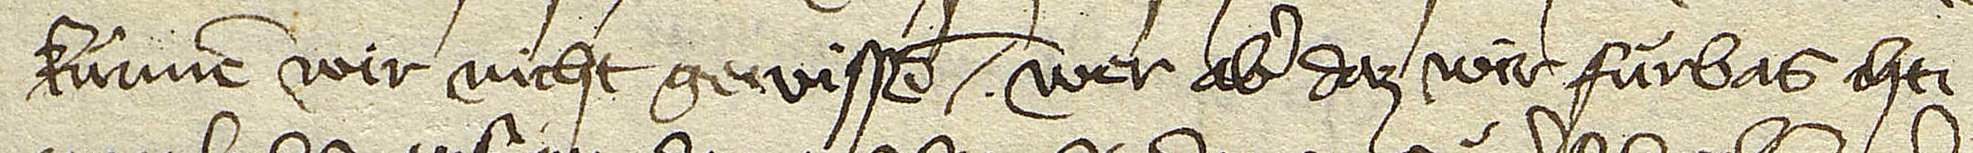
künne* wir nicht gewiſſe* / . wer ab* daʒ wir fürbas iht
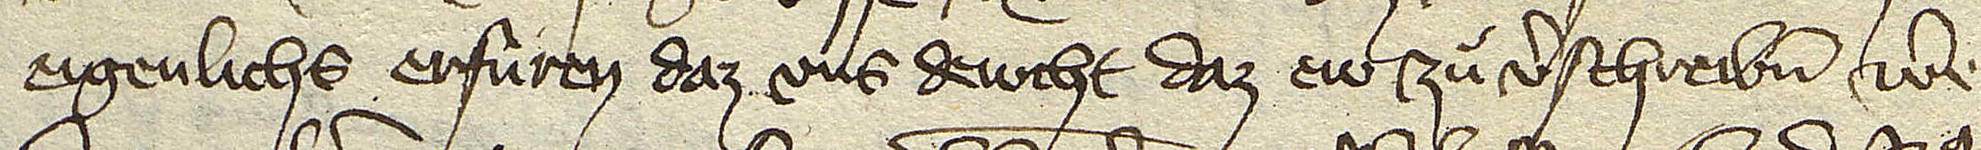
eigenlichs erfüren daʒ vns dewcht daʒ ew cʒü v*ſchreibn* w*e
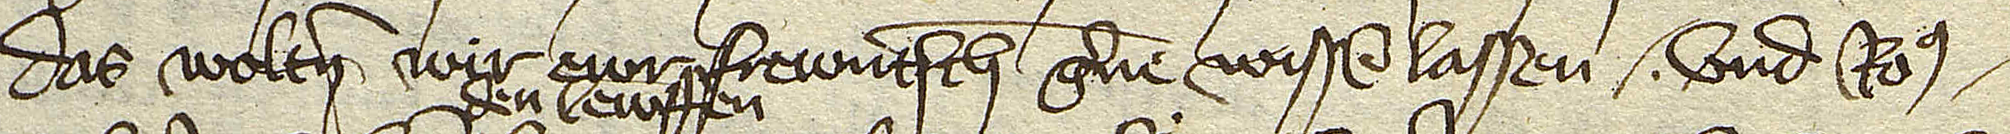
das woltn* wir ewr frewntſch* g*ne wiſſe laſſen / . vnd Ro* /
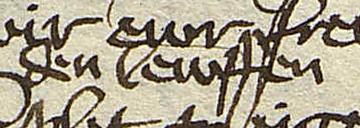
den lewffen
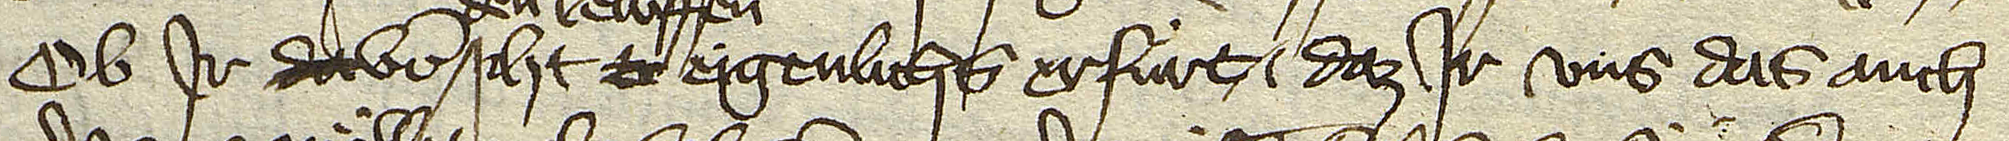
Ob Ir davo* iht er eigenlichs erfürt / daʒ Ir vns das auch
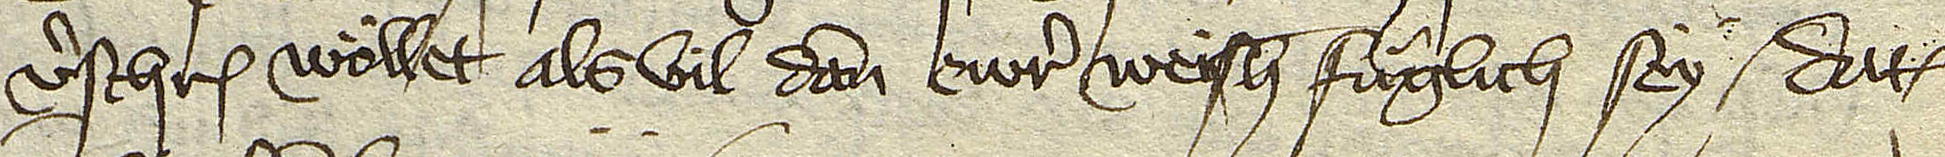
v*ſchr* wöllet als vil da*n ewr weiſh* füglich ſey / Dat*
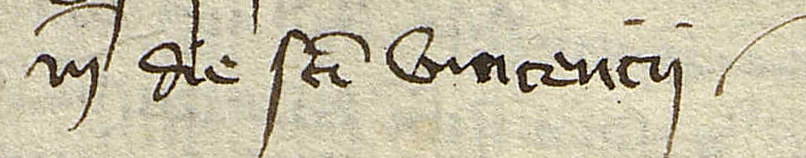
in die ſci* vincencii* /
